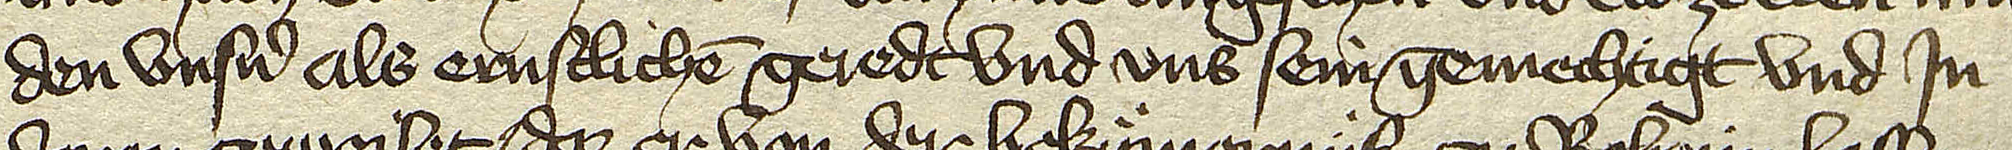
den vnſn* ernſtliche* geredt vnd vns ſein gemechtigt vnd In
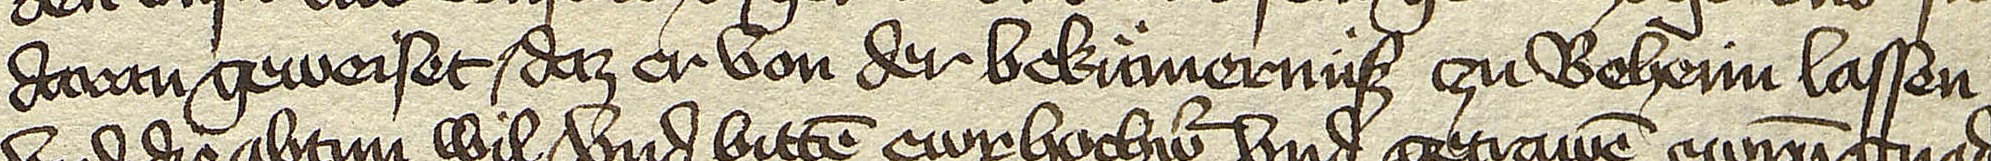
daran geweiſet / daʒ er von der bekümernüſʒ cʒu Beheim laſſen
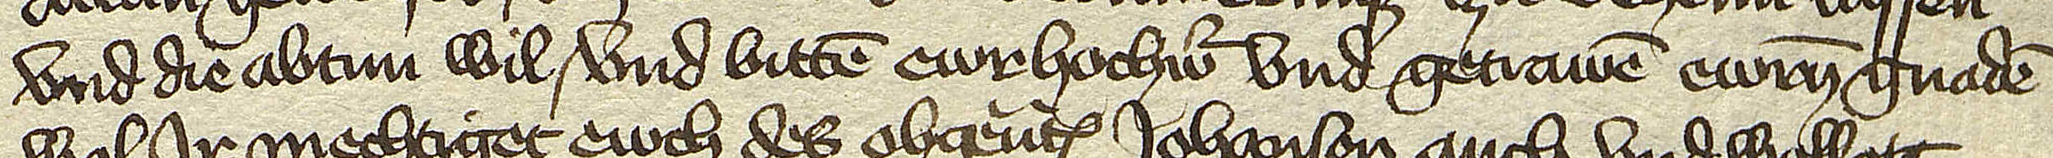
vnd die abtun wil / vnd bitte* ewr hochw* vnd getrawe* ewrn* gnade*
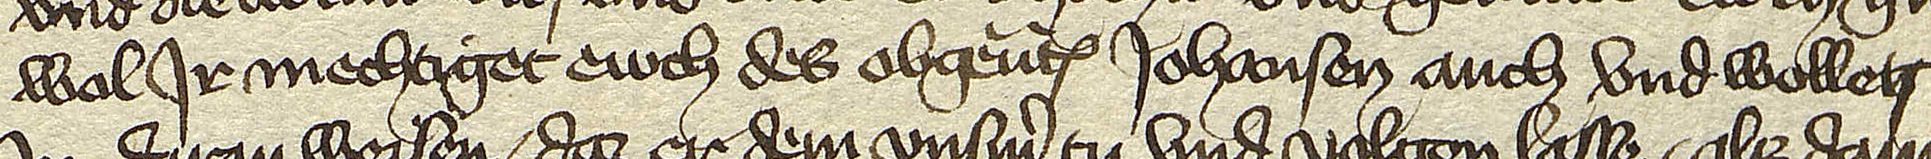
wol Ir mechtiget ewch des obgent* Iohanſen auch vnd wollet
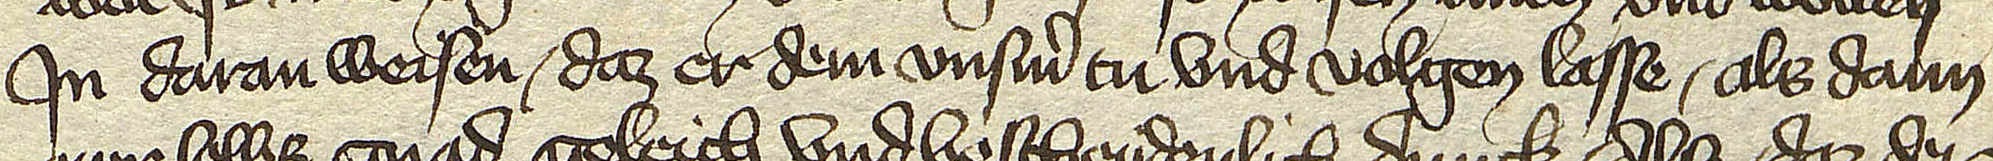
In daran weiſen / daʒ er dem vnſm* tu vnd volgen laſſe / als dann
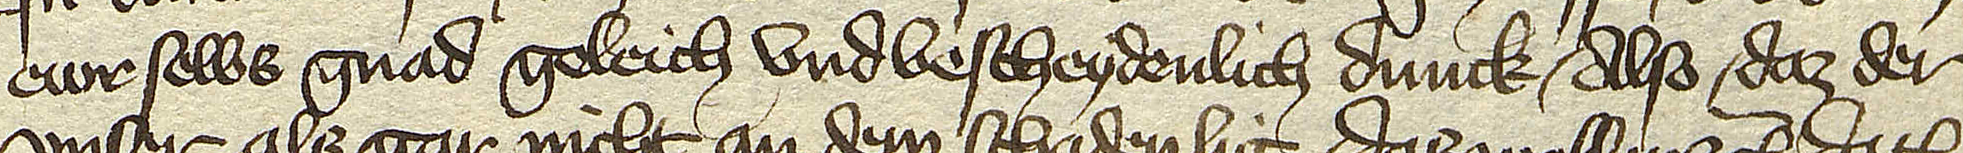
ewr ſelbs gnad geleich vnd beſcheydenlich dunck / Alſo / daʒ der
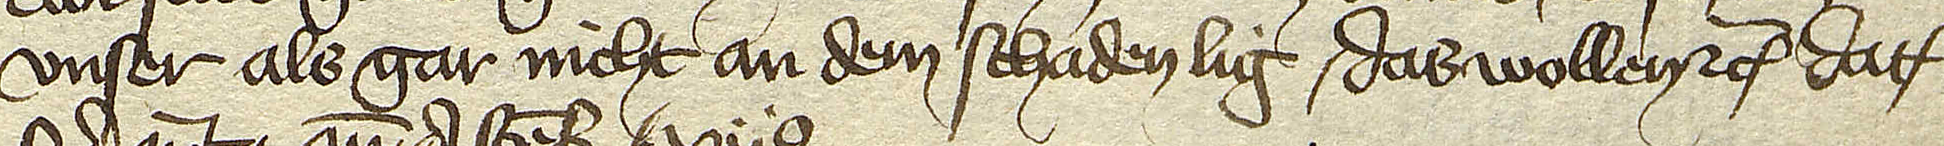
vnſer als gar nicht an dem ſchaden lig / das wollen ec* dat*
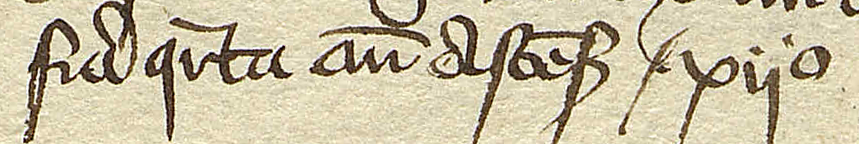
fia* qrta* an* Aſceſ* / . xii*
